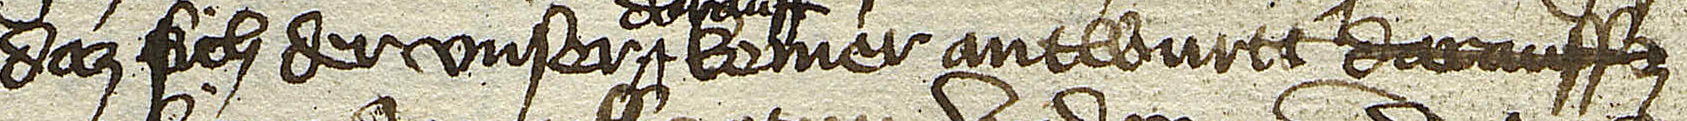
daʒ ſich der vnſer keiner antwurtt darauff ʒ
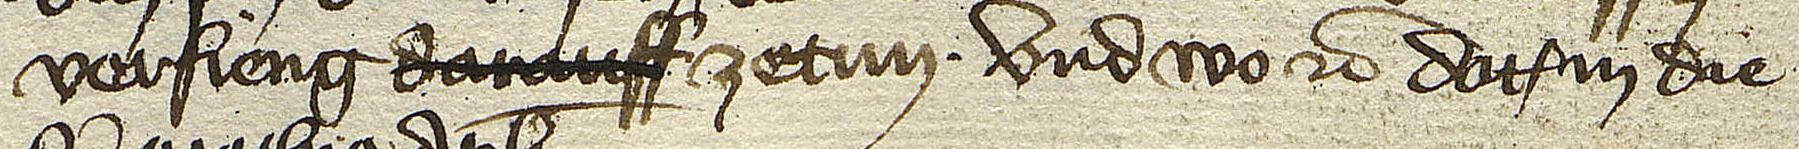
verfieng darauff ʒetun . Vnd wo ec* dat* in die
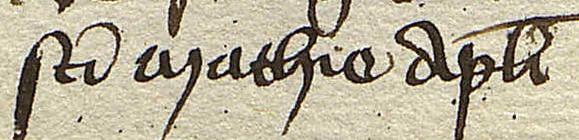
ſci* Mathie Apli*
